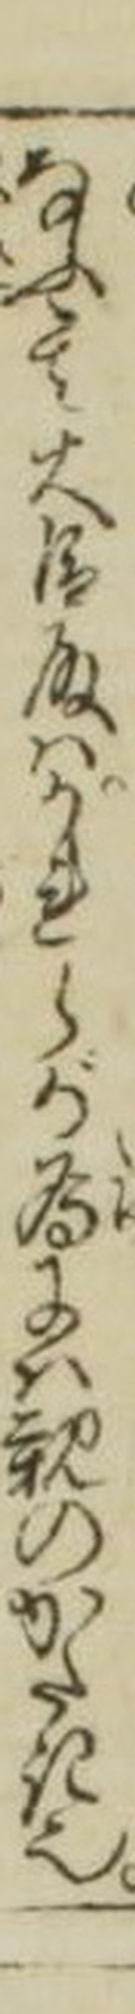なふ其大臣殿は。かれらが為には親のかたき也。
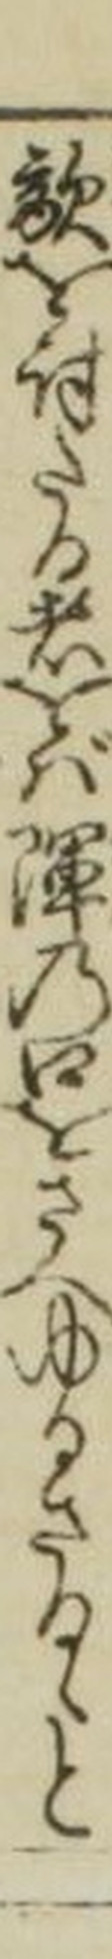敵を討たる者をば陣の口をさへゆるさるゝと
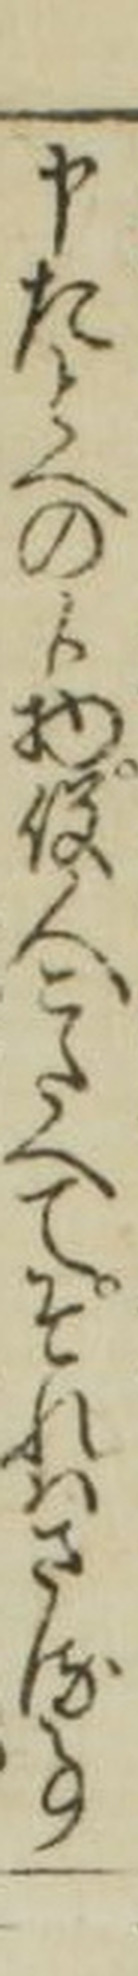申たとへの候物。役人こたへて。それはさる事
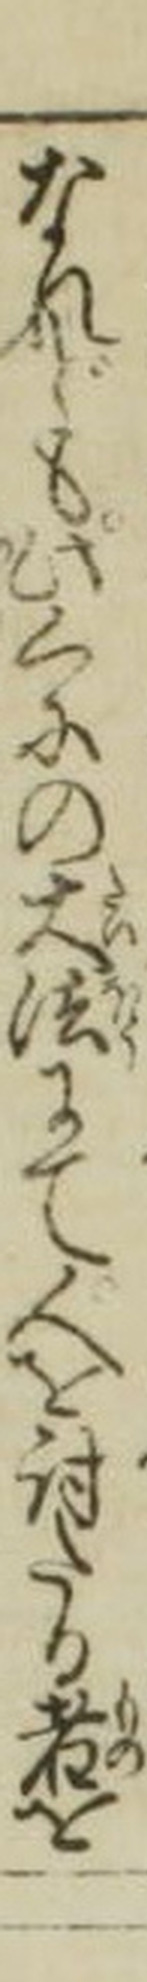なれども。此くにの大法にて人を討たる者を
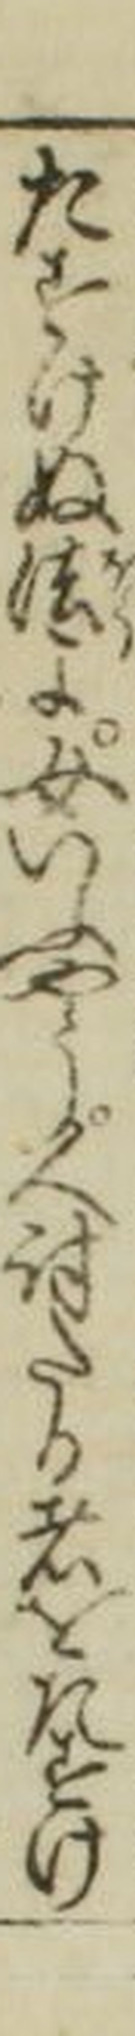たすけぬ法よ。女いふやう。人討たる者をたすけ
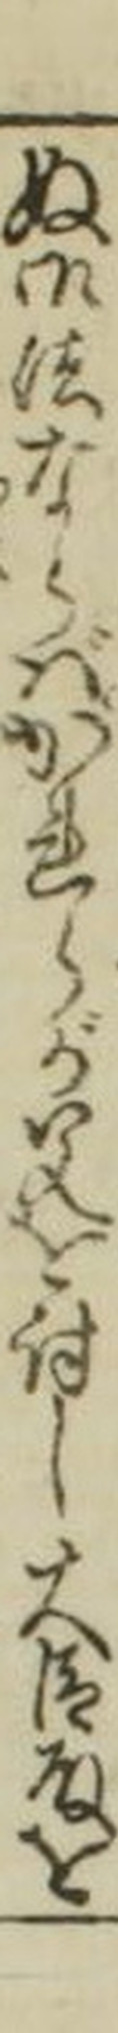ぬ御法ならば。かれらが父を討し大臣殿を
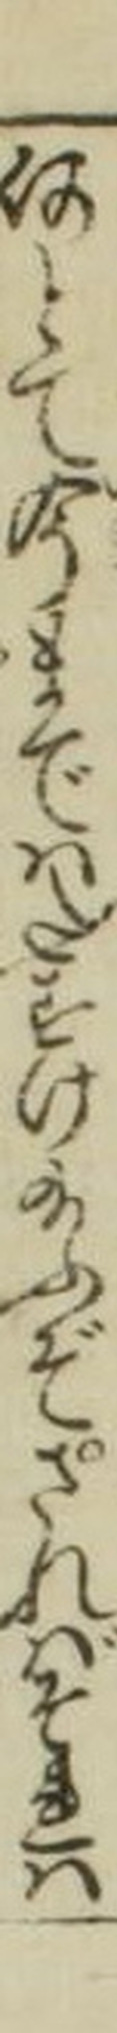何とて今まではたすけ給ふぞ。さればそれは
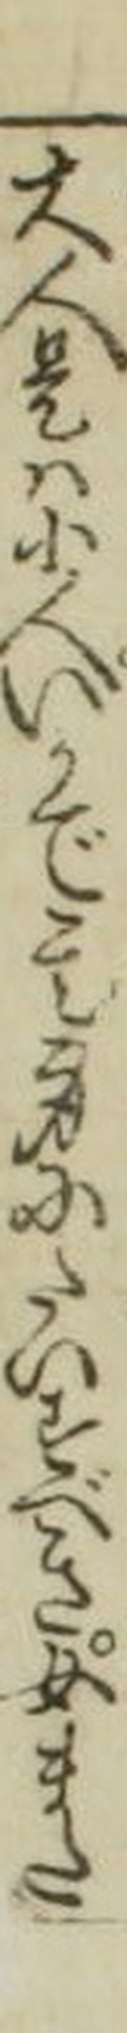大人是は小人。いかで其身にたいすべき。女また
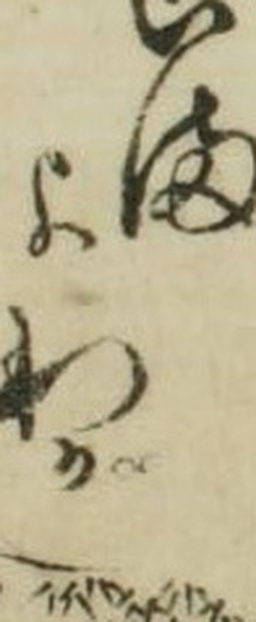よわが
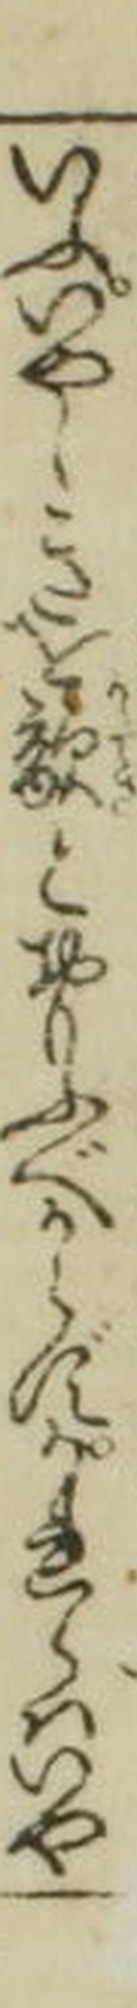いふ。いやしきを敵とおもふべからず。かれらはいや
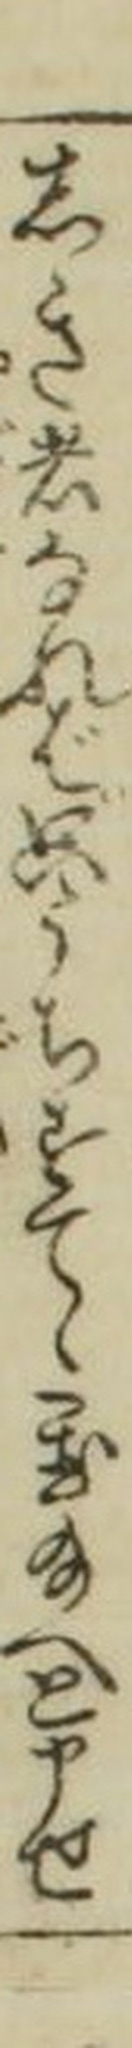しき者なれば。只うちすてゝ置給へと申せ
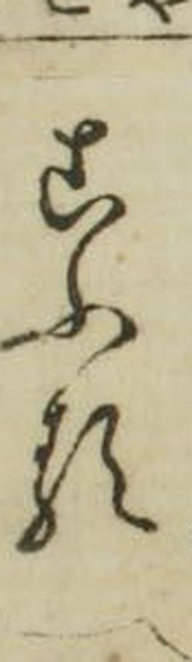こふる
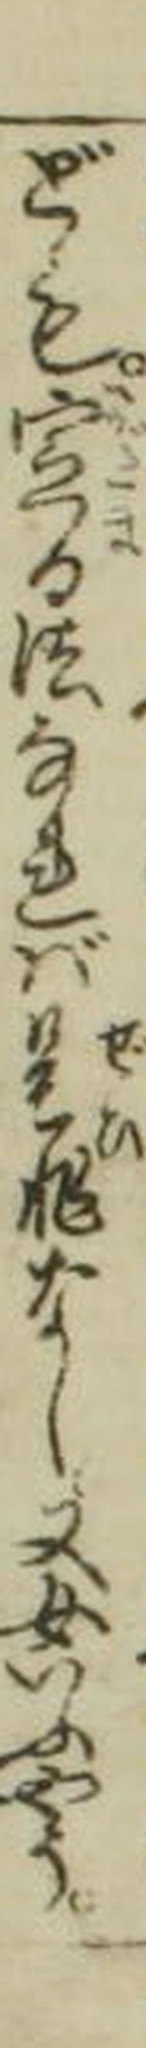ども。定る法なれば是飛なし。又女いふやう。
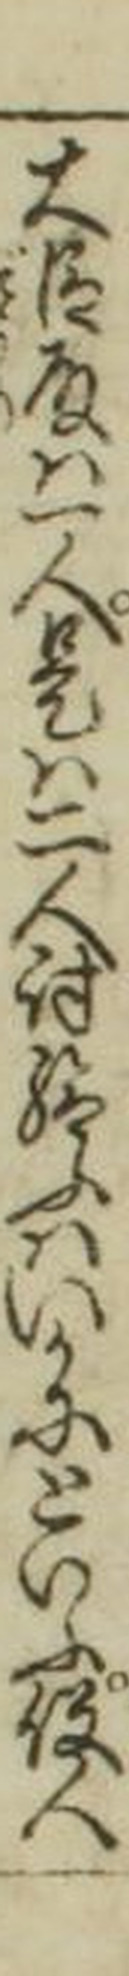大臣殿は一人。是は二人討給ふはいかにといふ。役人
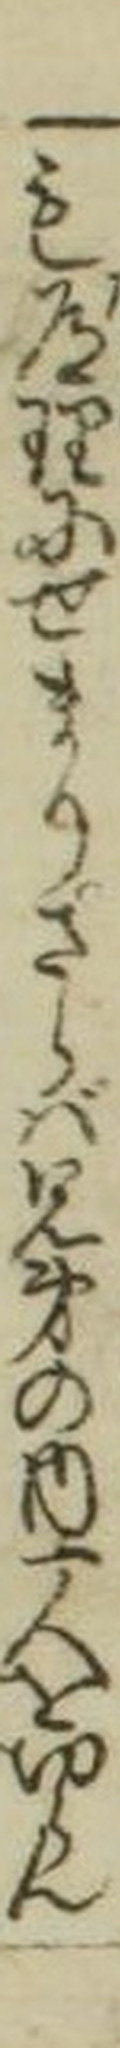も道理にせまり。さらば兄弟の内一人を切らん
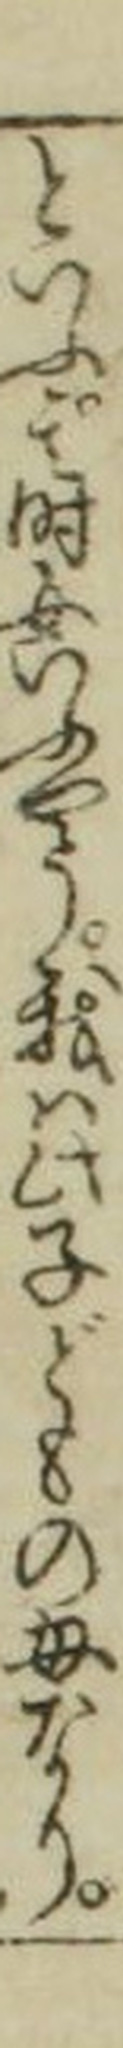といふ。其時女いふやう。我は此子どもの母なり。
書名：女源氏教訓鑑
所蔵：東京学芸大学附属図書館
